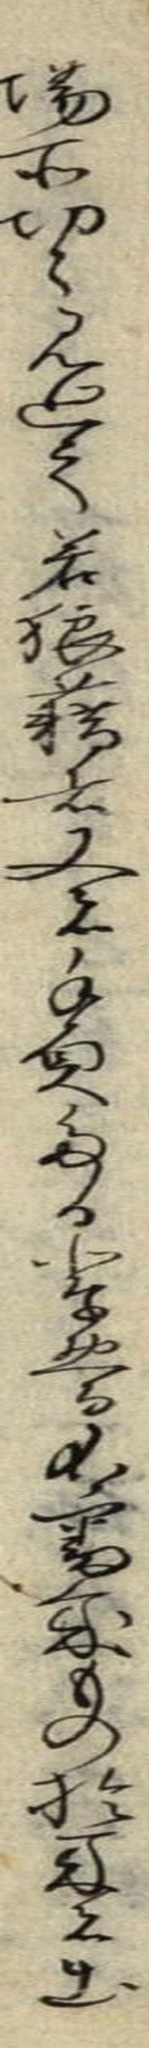場所切々見廻之若狼藉者又は手負たる輩惣て不審成もの於来は出
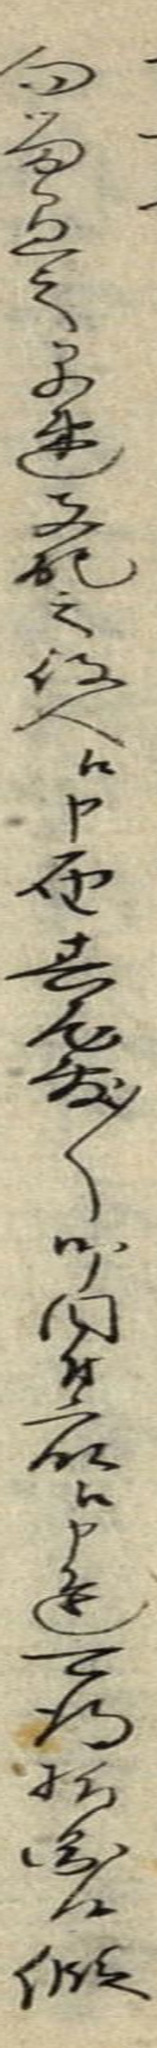向留置之早速支配之役人江申届其屋敷〳〵御目付衆江申達可得指図候仮
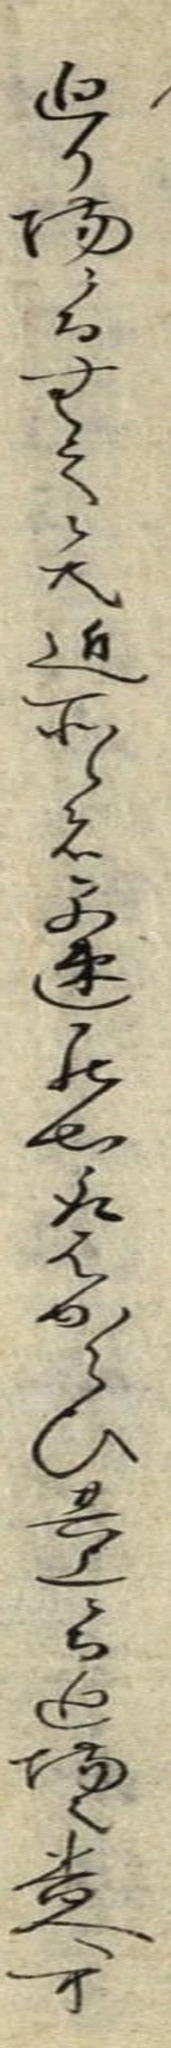廻り場にて無之候共近所之者早速罷出取はからひ其上にて廻場之番人へ可
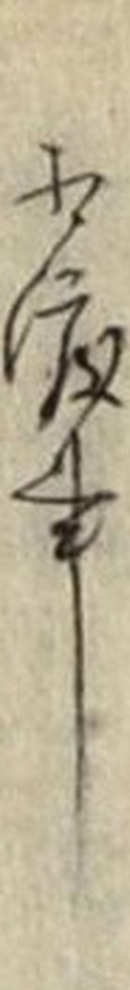相渡事
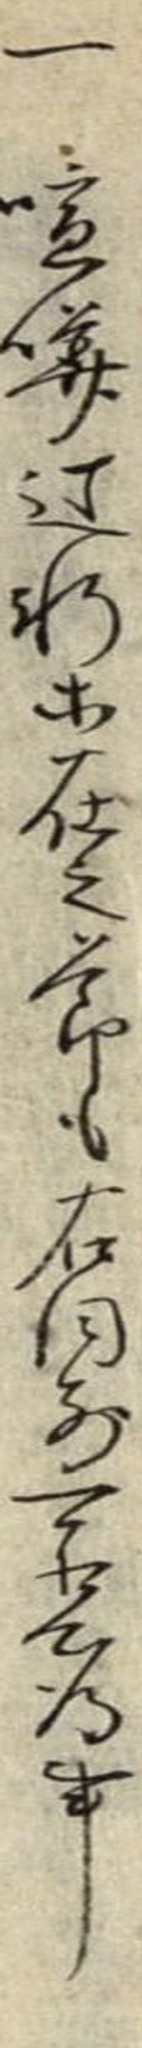一喧嘩辻斬等在之節も右同前可相心得事
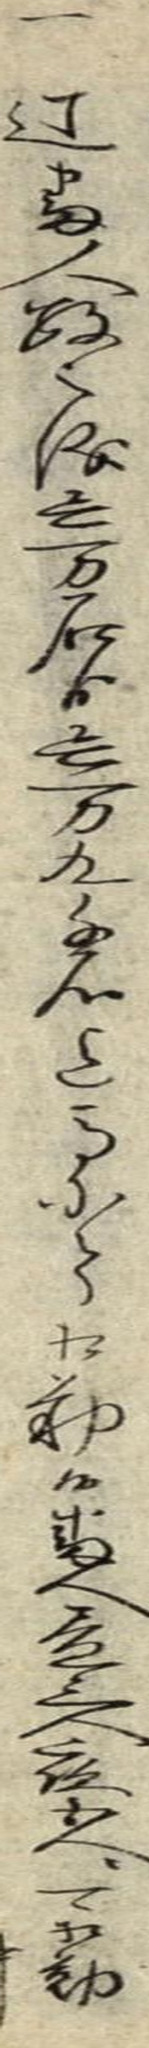一辻番人役之儀壱万石ゟ壱万九千石迄高にて相勤候番人昼三人夜五人に可相勤事
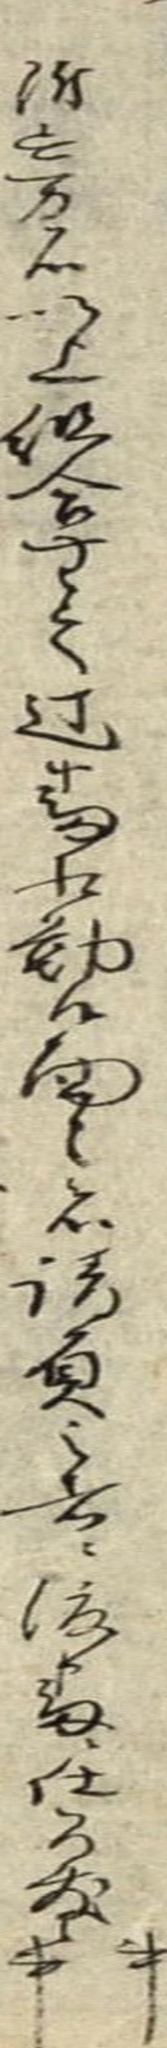附壱万石以上組合無之辻番相勤候面々は請負之者に渡番仕間敷候事
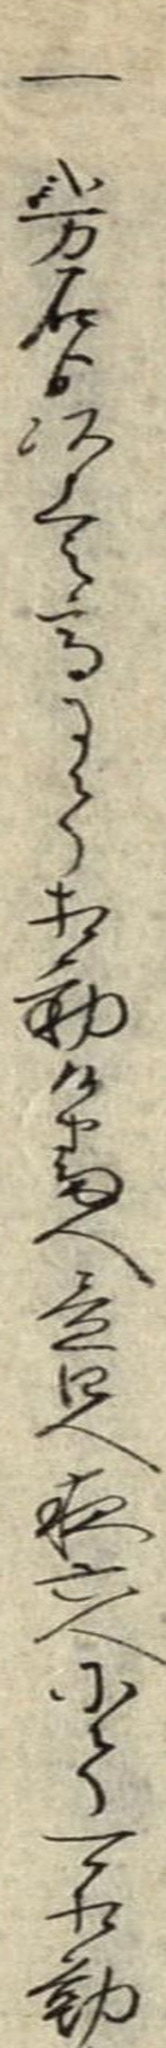一弐万石ゟ以上之高にて相勤候番人昼四人夜六人にて可相勤事
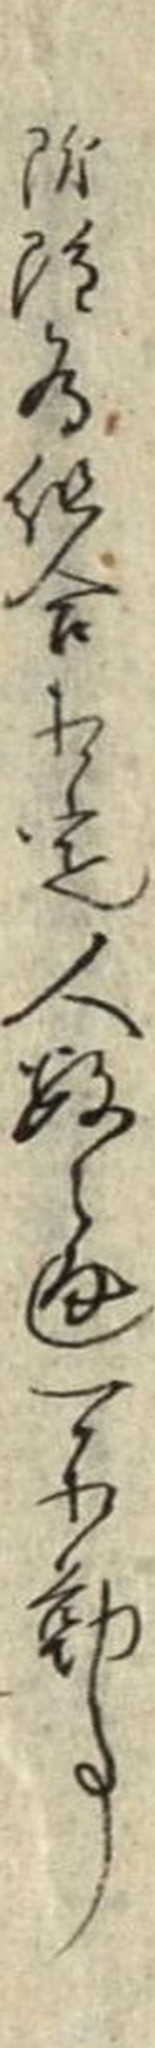附雖為組合相定人数之通可相勤事
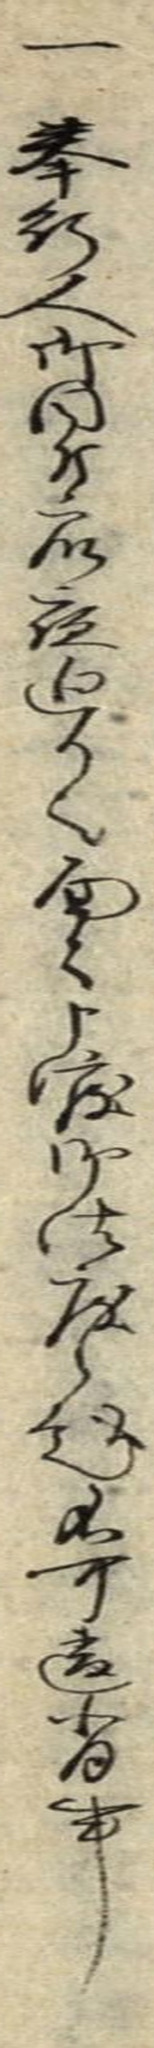一奉行人御目付衆夜廻之面々申渡御法度之趣不可違背事
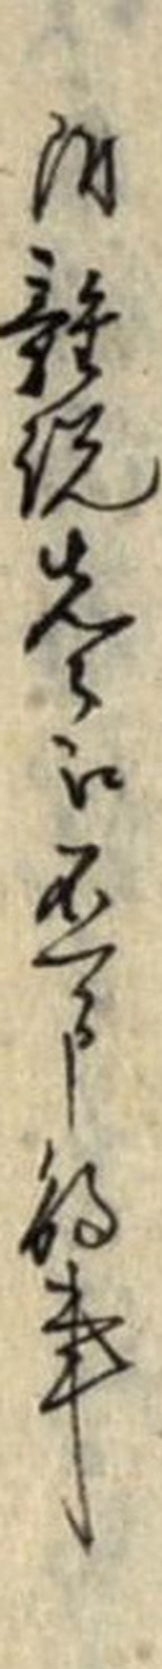附雑説先々江不可申触事

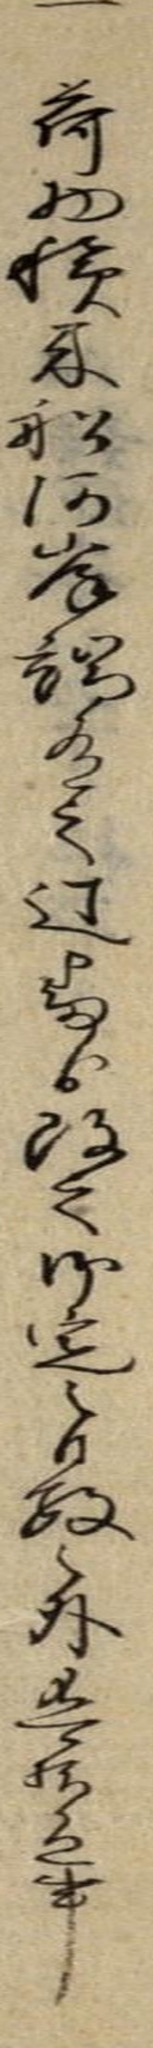一荷物積来船河岸端有之辻番ゟ改之御定之日数之外不可指置事
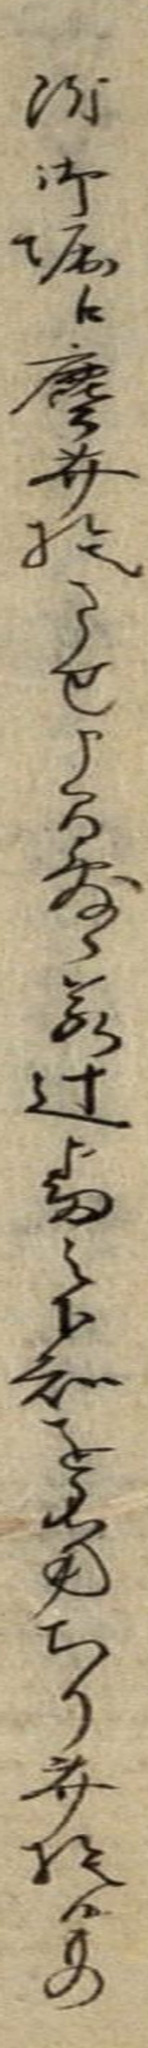附御堀江塵芥捨させ申間敷候若辻番之下知を不用ちり芥捨候もの
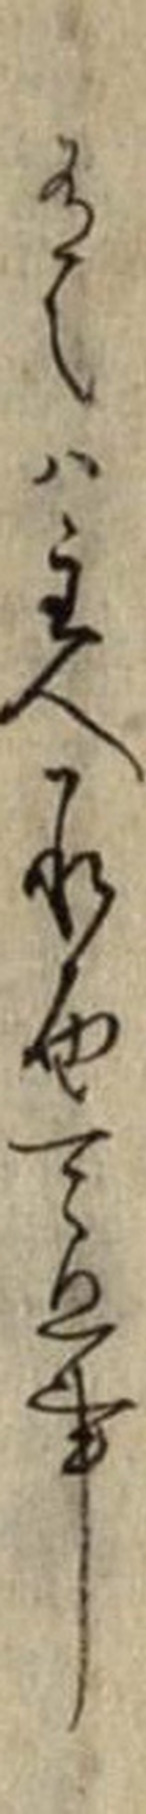有之は主人承届可置事
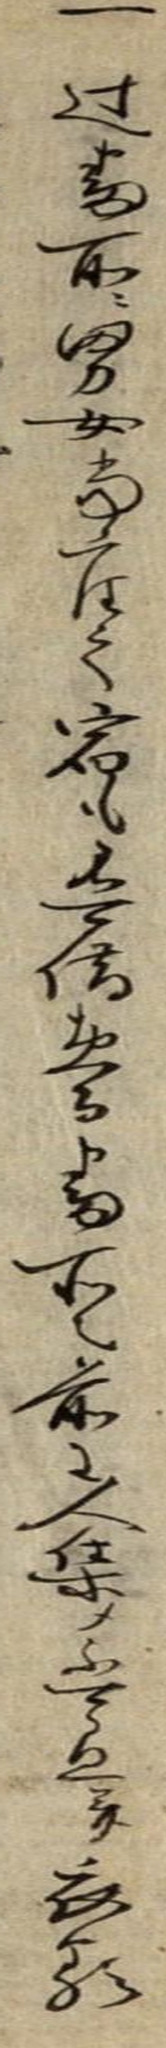一辻番所に男女当座之宿も不可借惣て番所之前に人集め不可置幷衣類
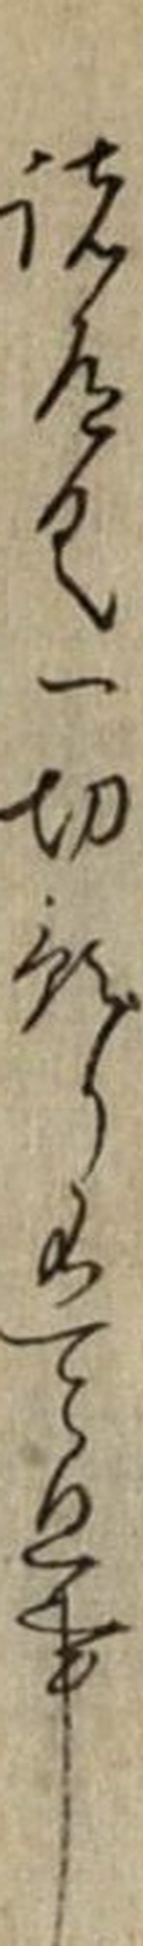諸道具一切預り不可置事
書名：三都并道中之部
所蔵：福井県文書館 Fukui Prefectural Archives
